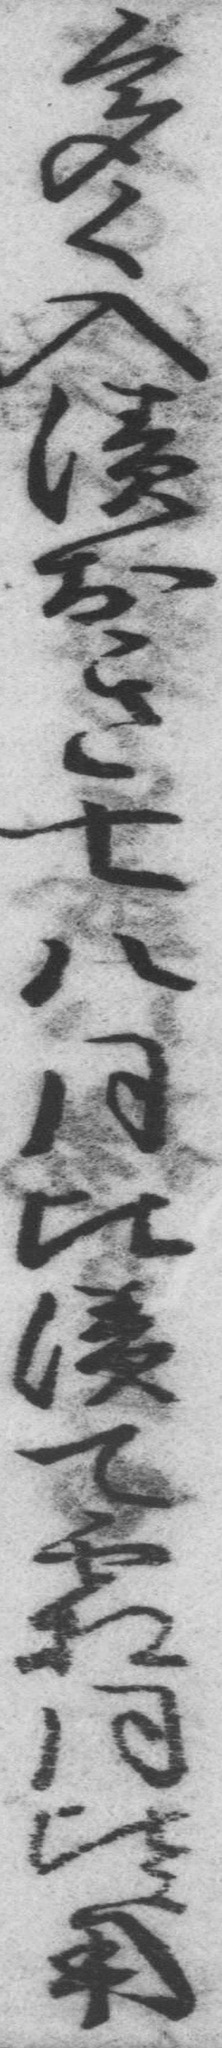多く入漬おき七八月比漬て霜月比に用
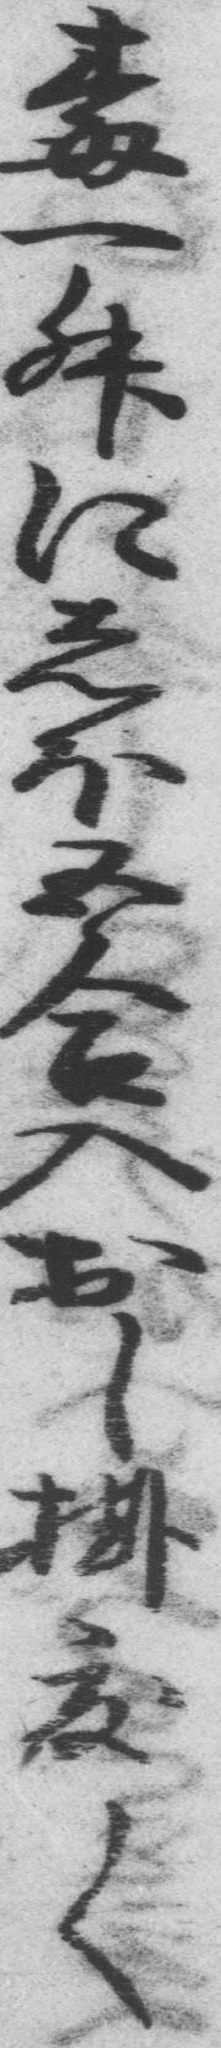梅一升にしほ五合入おし掛け度々
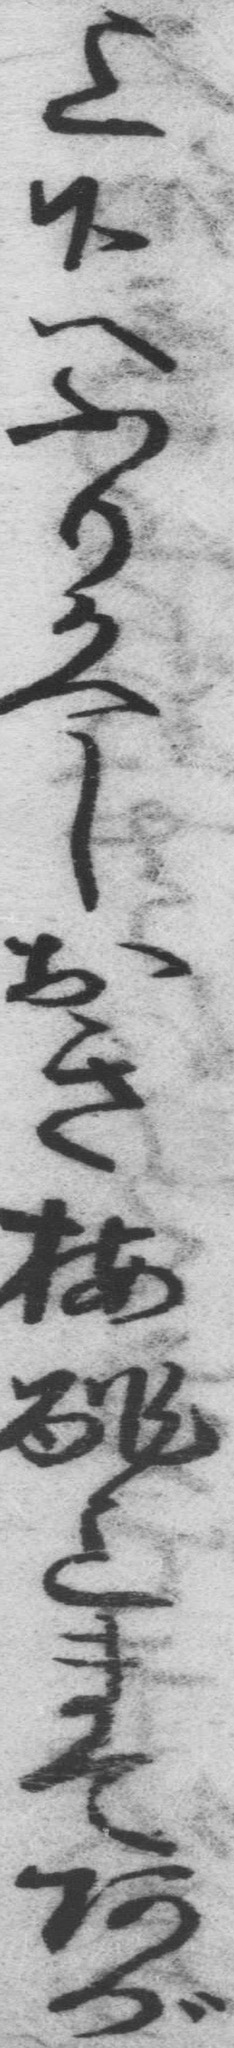上下へふりかへしおき梅酢上まてあが
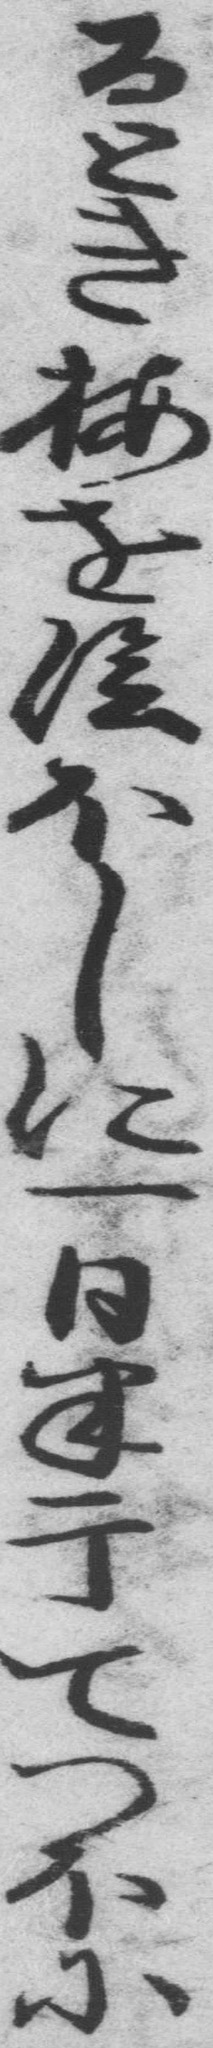るとき梅を陰ほしに一日半干てつほに
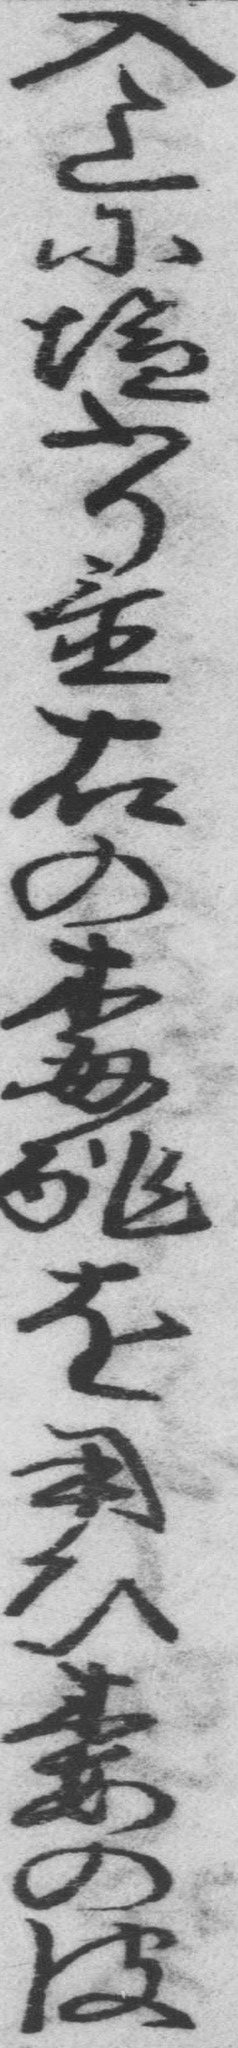入れ上に塩ふり置右の梅酢を用ひ梅の皮
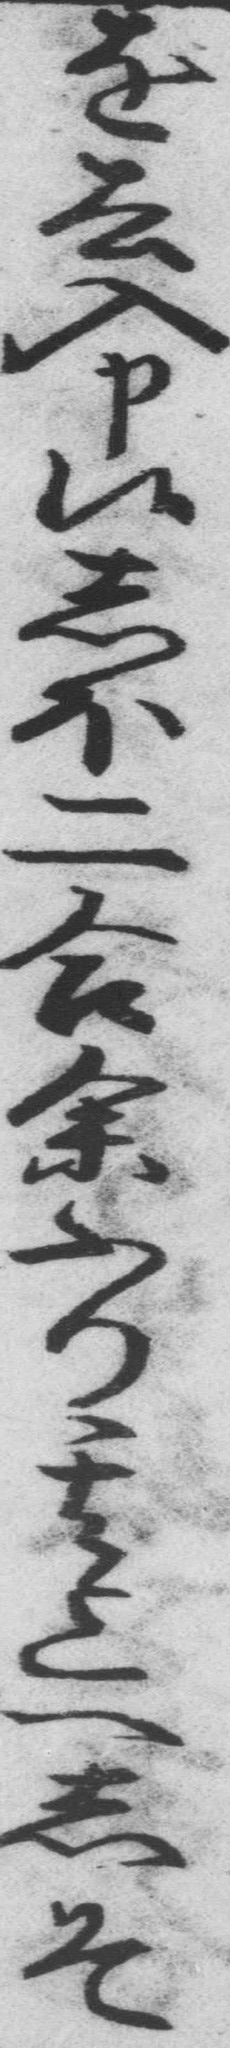を去入申候しほ二合余ふり其上へしそ
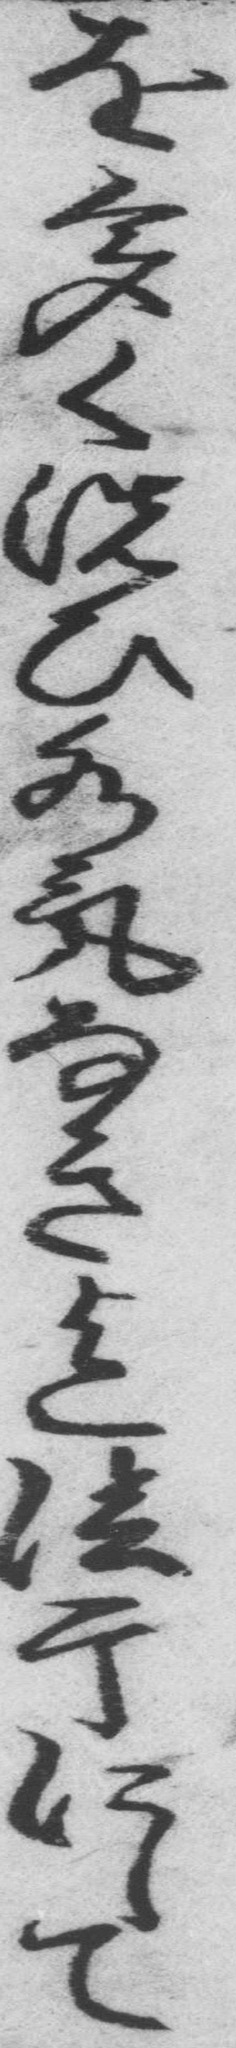を多く洗ひ水気なき迄陰干にして
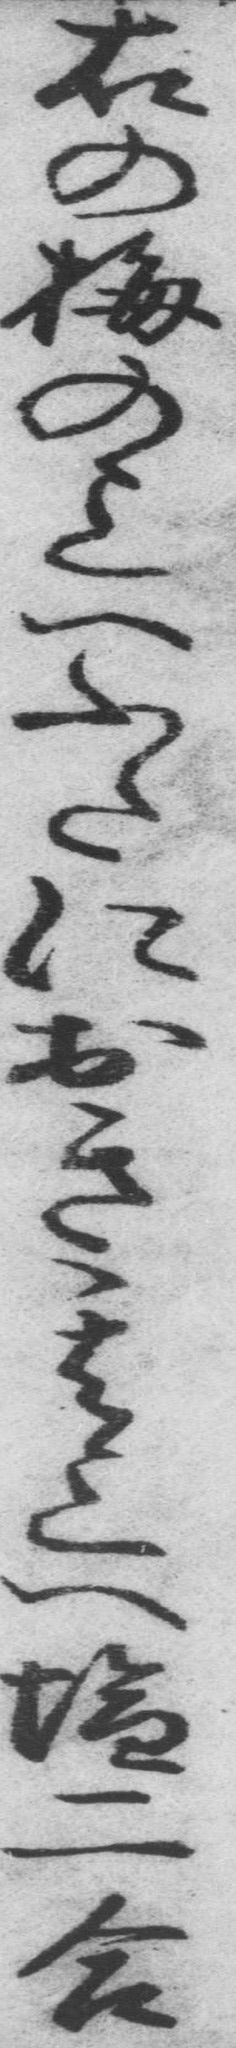右の梅の上へふたにおき其上へ塩二合
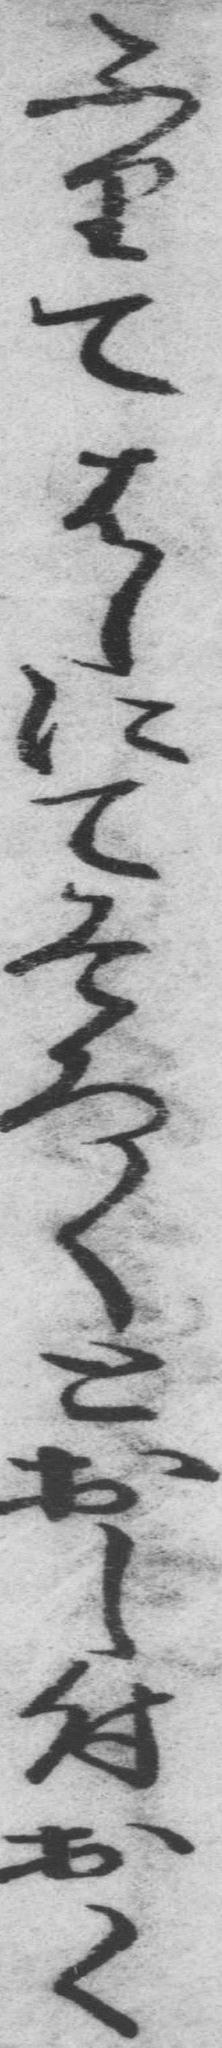ふりてはしにてそろ〳〵とおし付おく
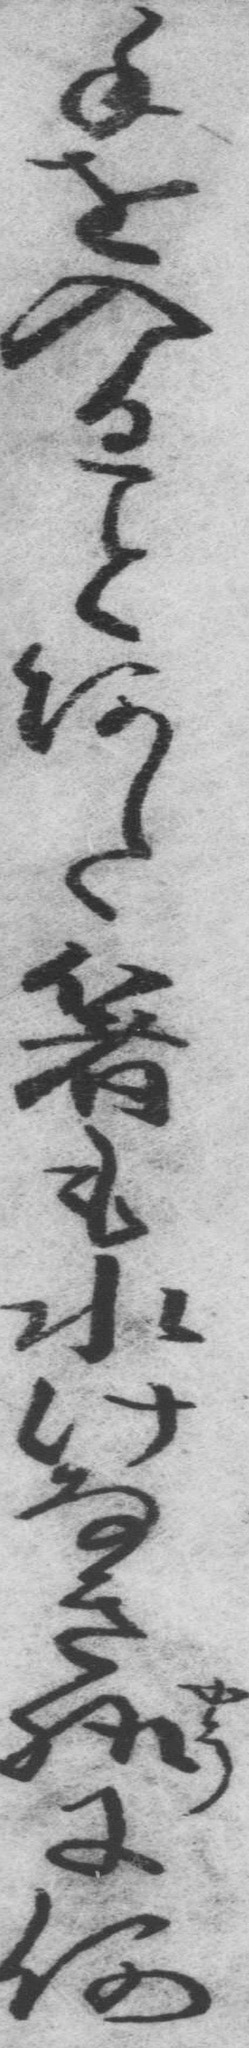手を入ることあしく箸も水けなき様に何
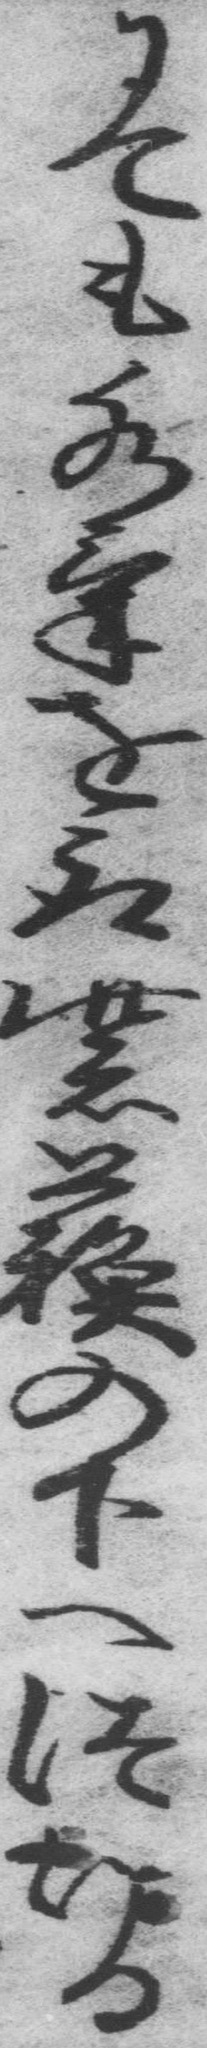にても水気を取紫蘇の下へつける
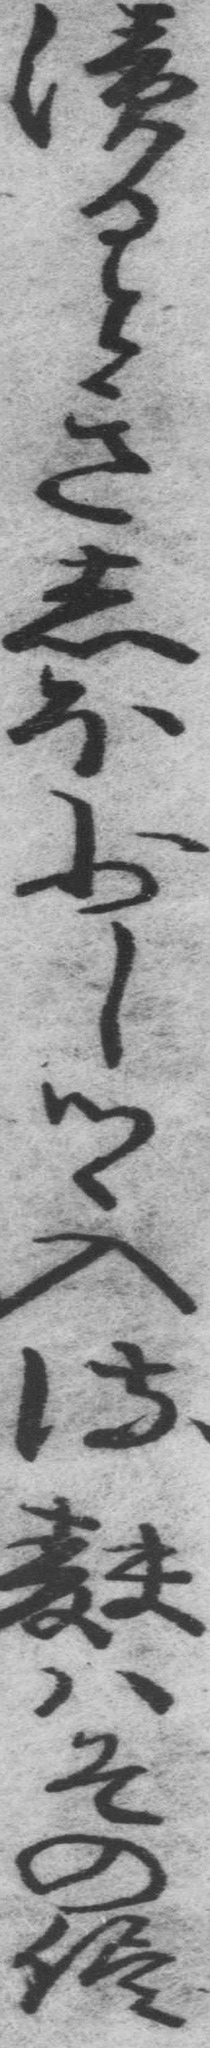浸るときしほ少しつゝ入る麩はその侭

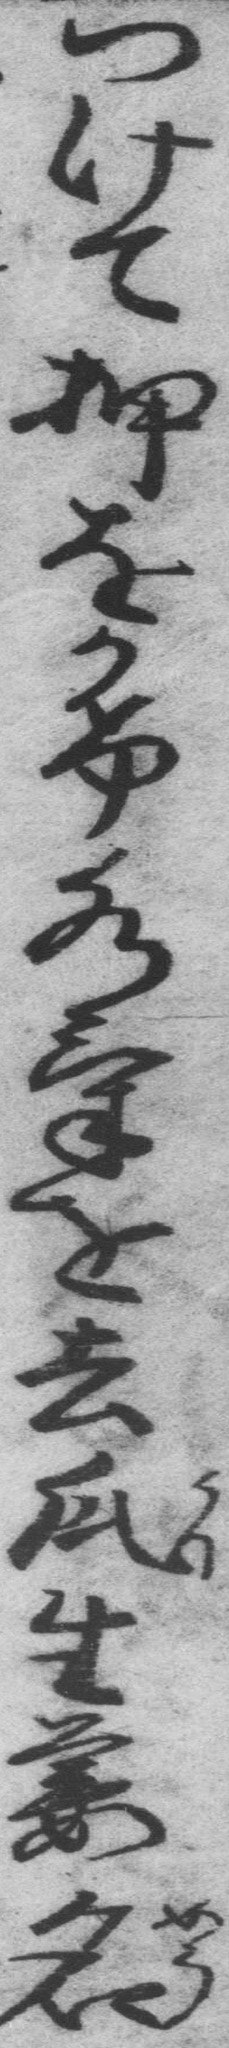つけて押をかけ水気を去瓜生姜名
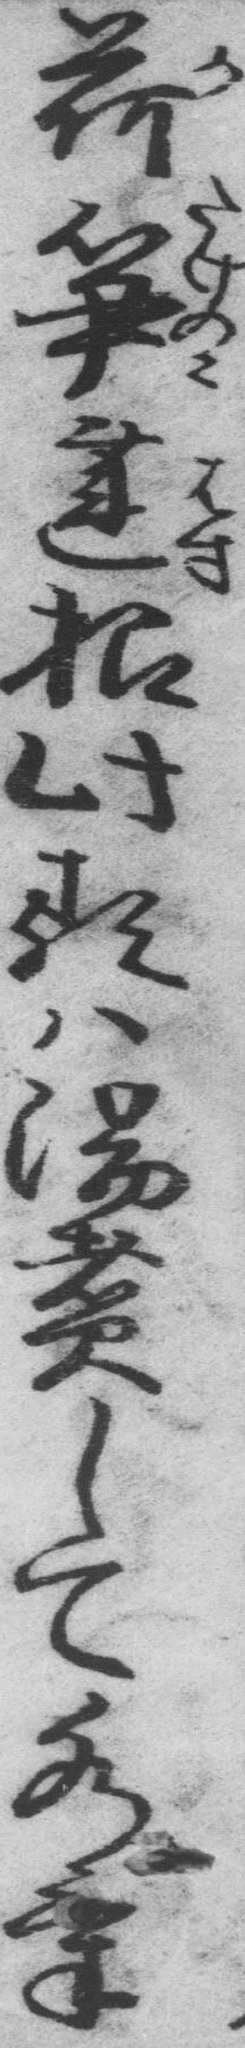荷笋蓮根此類は湯煮して水気
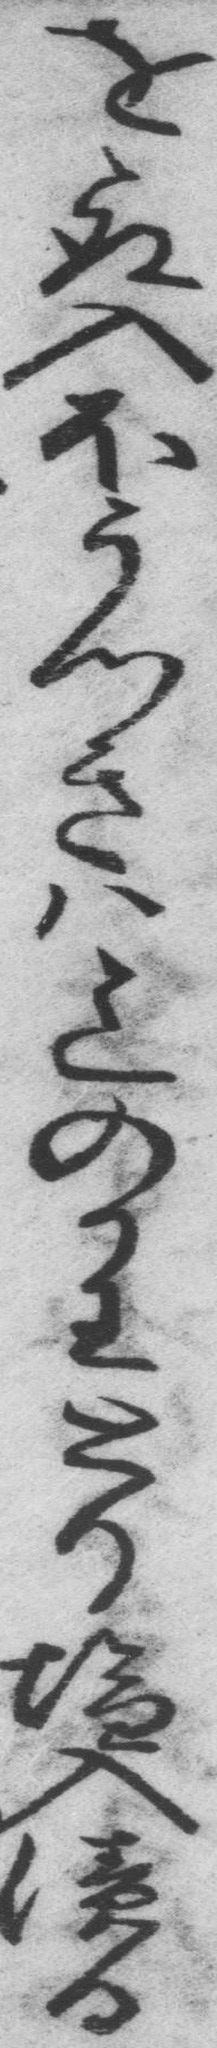を取入ほうつきは上のかわとり塩入漬る
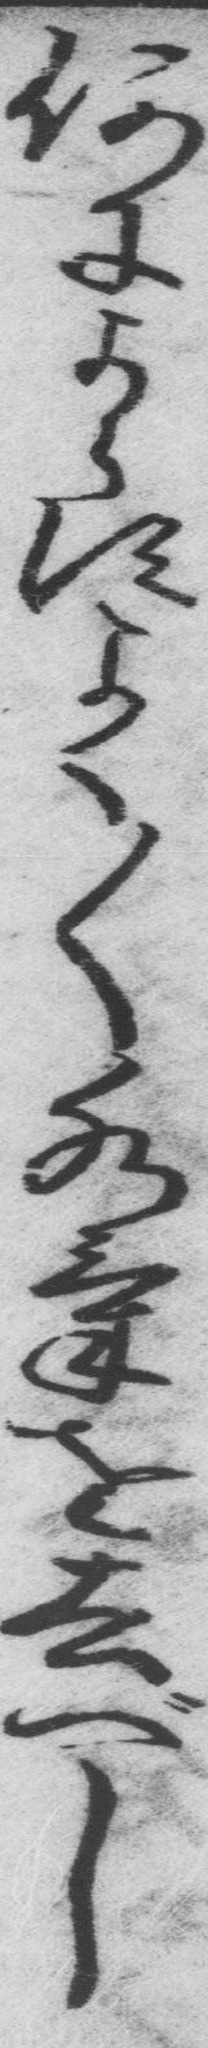何によらずよく〳〵水気を去べし
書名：料理山海郷
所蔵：大阪府立大学学術情報センター 国文学研究資料館
